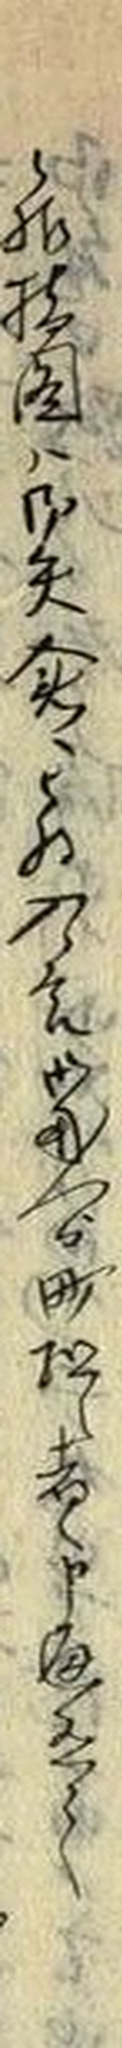之様指図ハ御矢倉へ被為入候節御用人ゟ町担之者へ申通有之
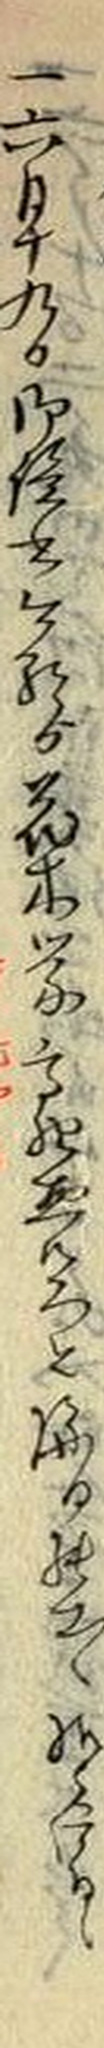一六月十九日御読書今朝ゟ花木栄高野惣左衛門と隔日罷出候様被仰付候
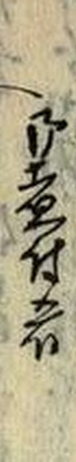御煮付肴一重
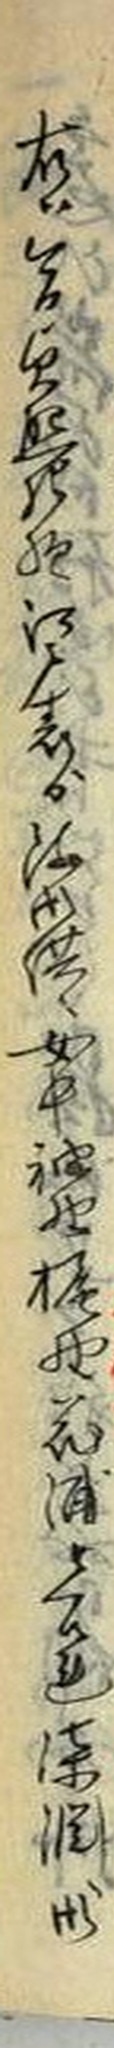右ハ今日貞照院様江戸表ゟ致御供候女中袖野梶野花浦被召連漆淵へ御
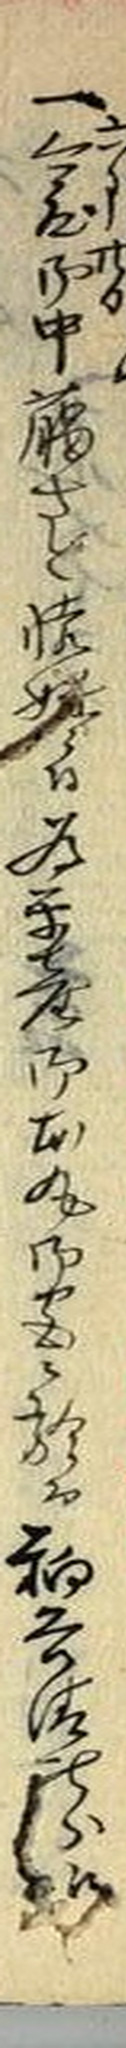一今度御中臈さと懐妊ニ付為平産御本丸御宮ニ於而粕谷清次郎江
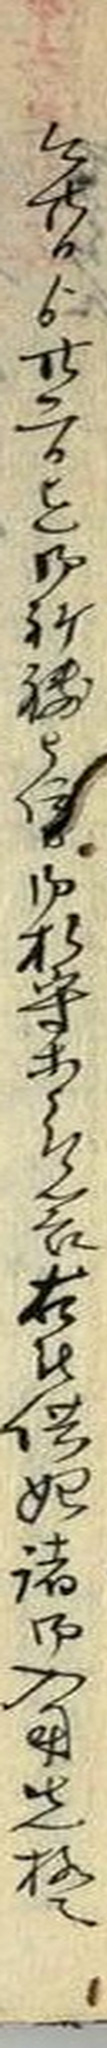今廿日ゟ廿二日迄御祈祷被仰付御札守等被下候筈右被供始諸御入用先格之
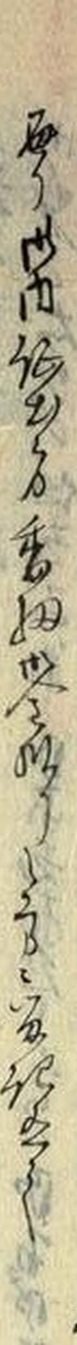通り御内証出方委細御金掛り之方ニ留記有之
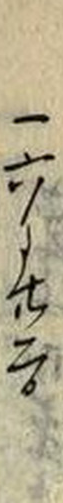一六月廿二日
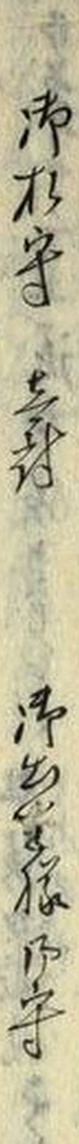御札守壱封御出生様御守
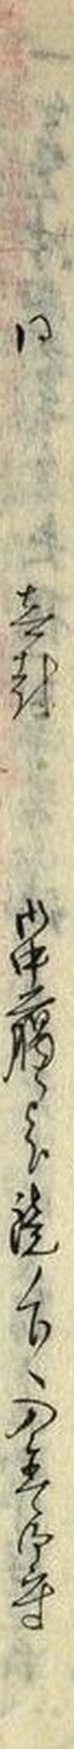同壱封御中臈へ被下鏡ノ下へ入置候御守
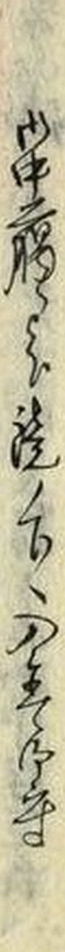同壱封御中臈へ被下鏡ノ下へ入置候御守
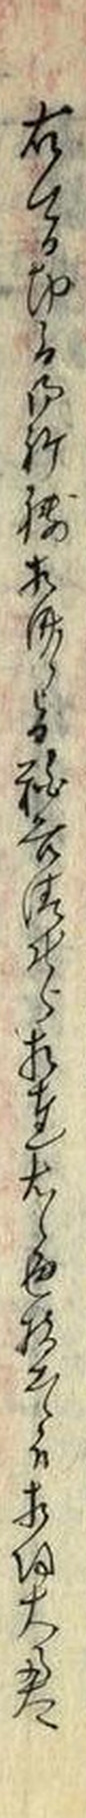右今日切ニ而御祈祷相済候旨粕谷清次郎相達右之通指出候ニ付相伺大奥へ
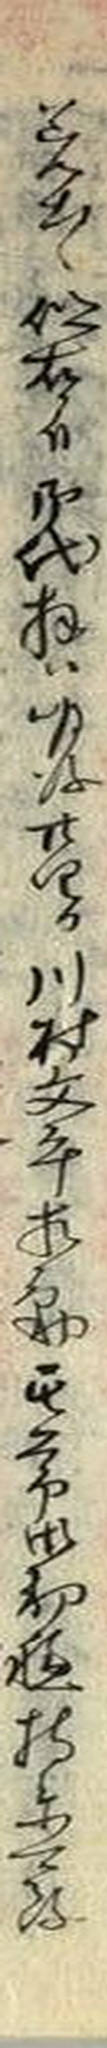差出候但右ニ付御代拝ハ明後廿四日川村文平相勤其節御初穂持参可致
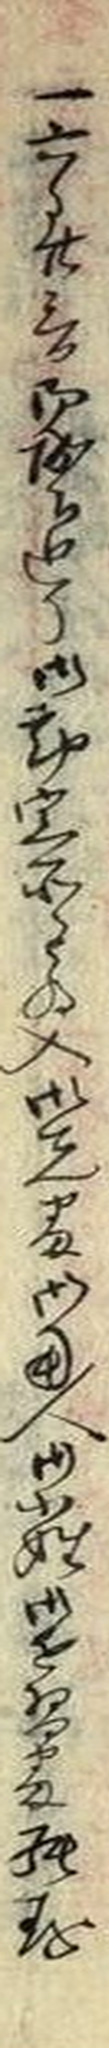一六月廿三日御城下廻り御勘定所へ被為入御先番御用人御小姓御近習番罷越
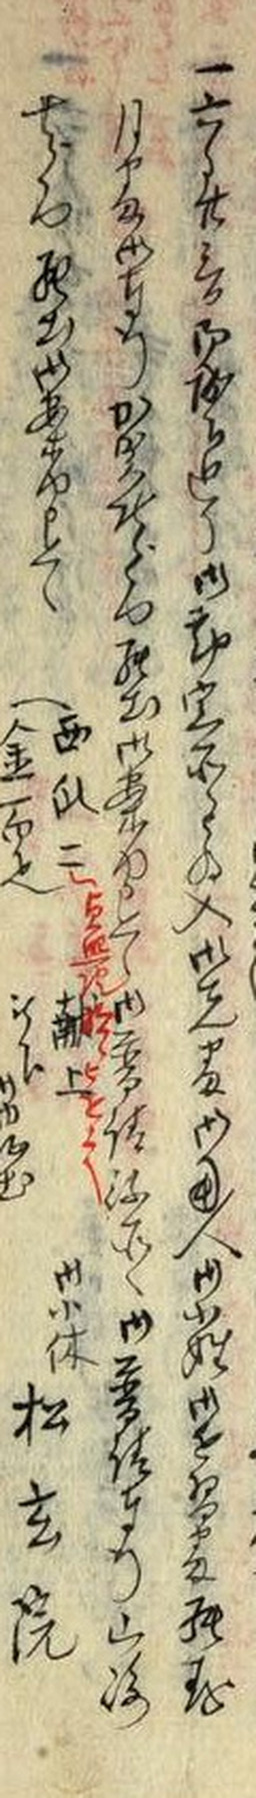月番御奉行加賀次郎右衛門罷出御案内申上候御普請役所へ御普請奉行山崎
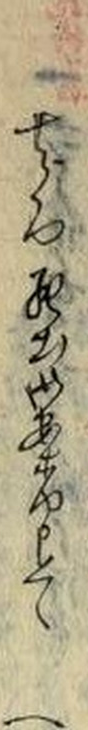七郎右衛門罷出御案内申上候
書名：少傅日録抄（斉承付側向頭取日記、在国）
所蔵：福井県文書館 Fukui Prefectural Archives
